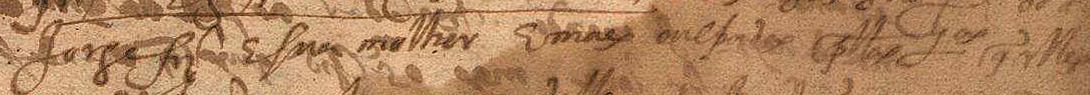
Jorge frz̄ E sua molher E maes culpadas p̄llas tas q̄ elles
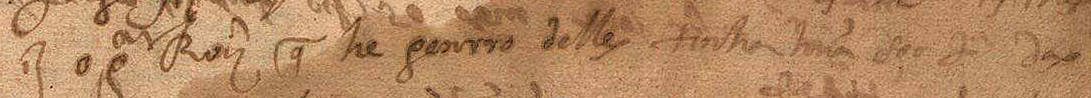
item o gar Roiz̄ q̄ he genrro delles tinha huā soo ta das
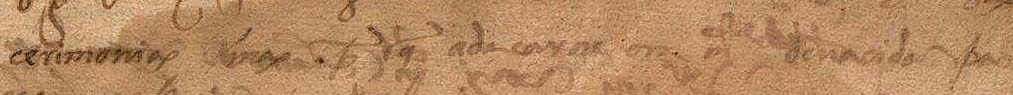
cerimonias / mas p̄oq̄ a decarou em mta deuacidaõ pare
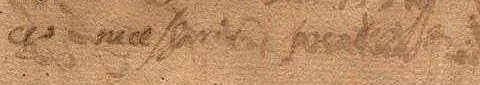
ceo necessario prendersse.
